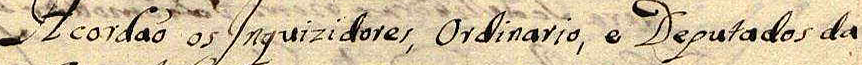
Acordaõ os Jnquizidores, Ordinario, e Deputados da
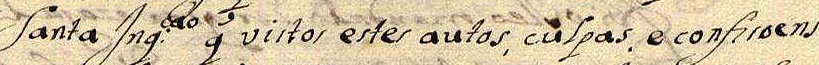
Santa Jnq.caõ q̄ vistos estes autos, culpas, e confisoens
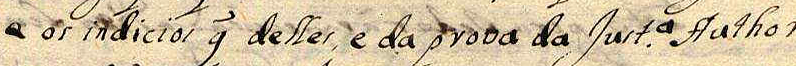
e os indicios q̄ delles, e da prova da Just.a Author
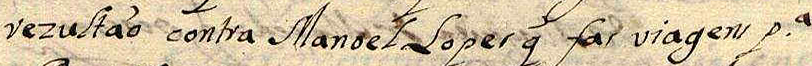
rezultaõ contra Manoel Lopes q̄ fas viagens p.a
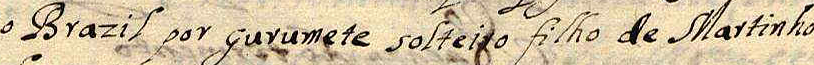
o Brazil por gurumete solteiro filho de Martinho
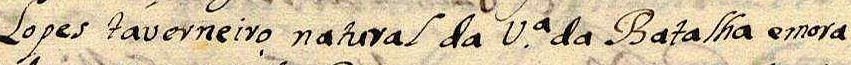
Lopes taverneiro, natural da V.a da Batalha e mora
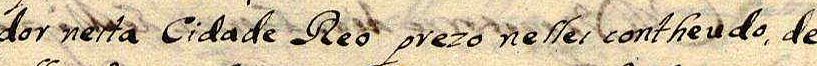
dor nesta Cidade Reo prezo nelles contheudo, de
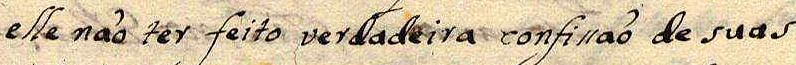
elle naõ ter feito verdadeira confissaõ de suas
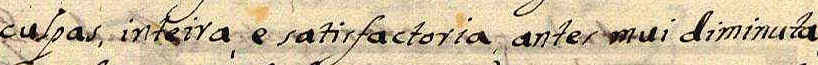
culpas, inteira, e satisfactoria, antes mui diminuta,
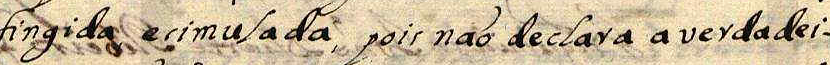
fingida, e cimulada, pois naõ declara a verdadei
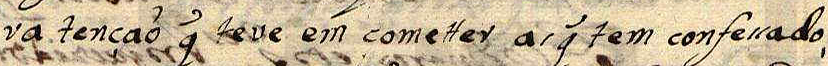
ra tençaõ q̄ teve em cometter as q̄ tem confessado,
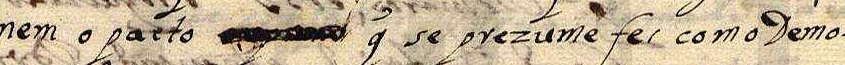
nem o pacto _______ q̄ se prezume fes com o Demo
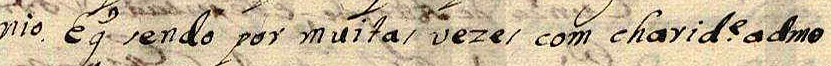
nio E q̄ sendo por muitas vezes com charid.e admo
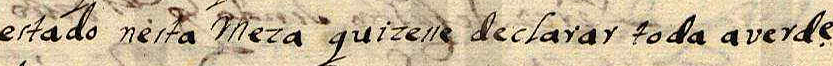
estado nesta Meza quizesse declarar toda a verd.e
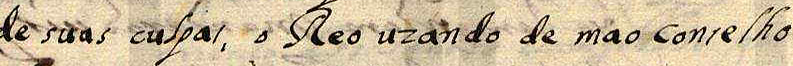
de suas culpas, o Reo uzando de mao conselho
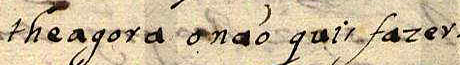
the agora o naõ quis fazer.
